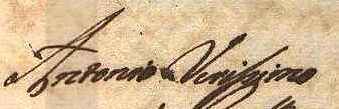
Antonio Verissimo
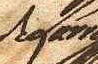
de Larre
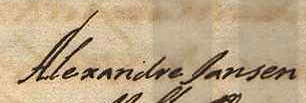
Alexandre Jansen
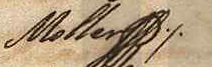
Moller
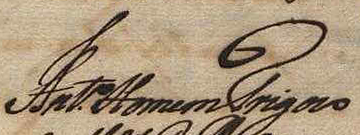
Ant.o Homem Trigozo
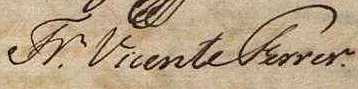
Fr. Vicente Ferrer.
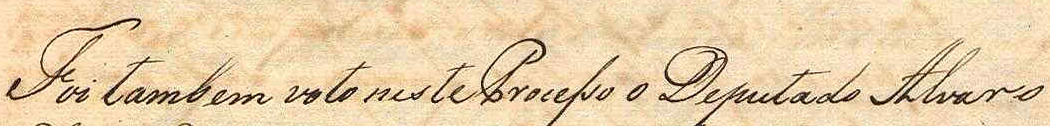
Foi tambem voto neste Processo o Deputado Alvaro
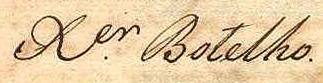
X.er Botelho.
